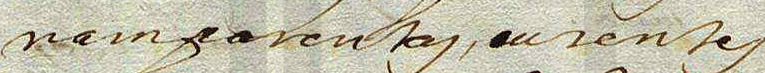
nam parentas, auzentes
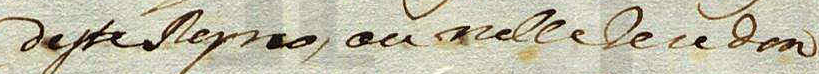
deste Reyno, ou nelle Rezeden
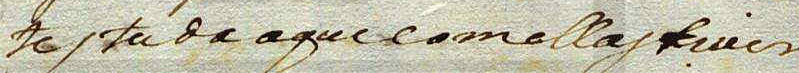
tes tudo o que com ellas tiuer
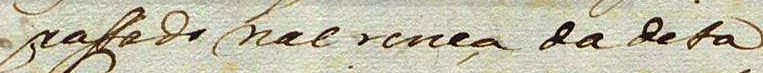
passado na crença da dita
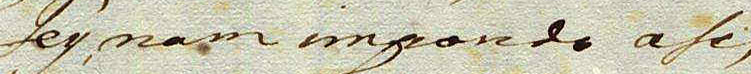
Ley, nam impondo a si,
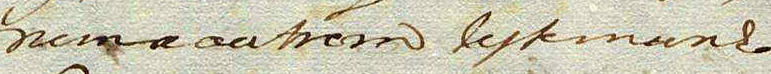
nem a outrem testemunho
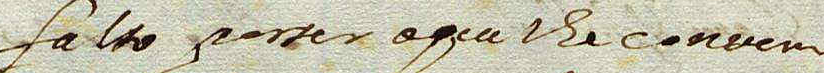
falso por ser o que lhe convem
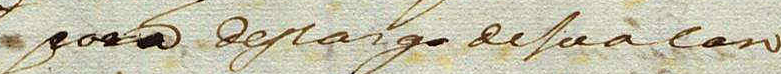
para descargo de sua con
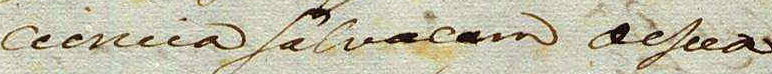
ciencia salvaçam de sua
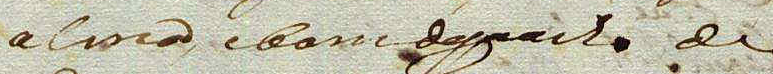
alma, e bom despacho de
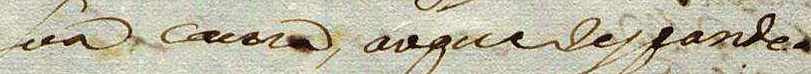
sua cauza, ao que Respondeo
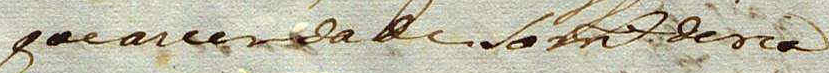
que a verdade somte diria
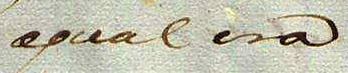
a qual era
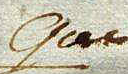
Que
